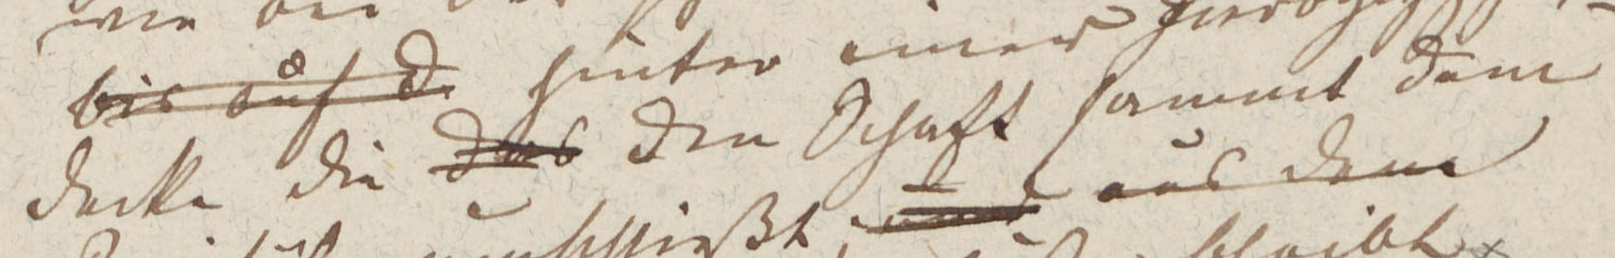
decke die das den Schaft sammt dem
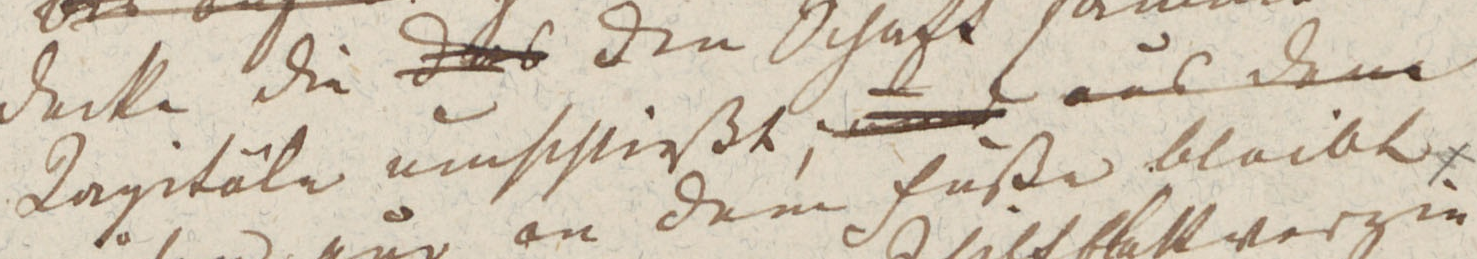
Kapitäle umschliesst, und aus dem
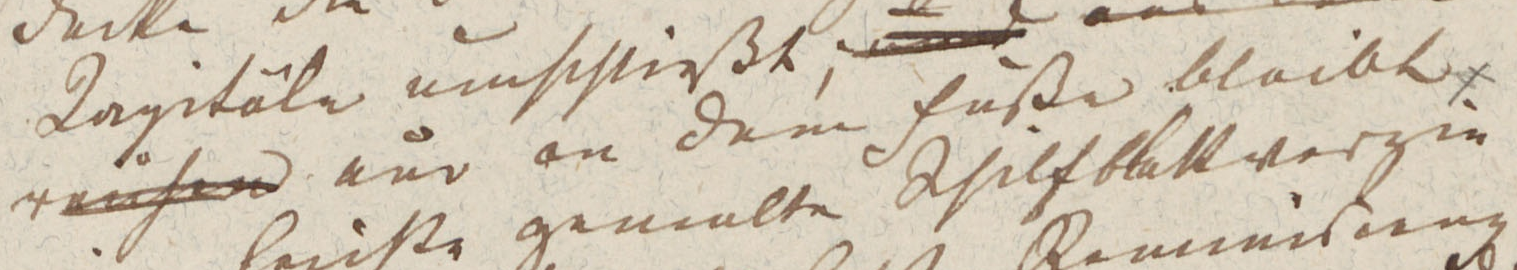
reichen nur an dem Fusse bleibt,
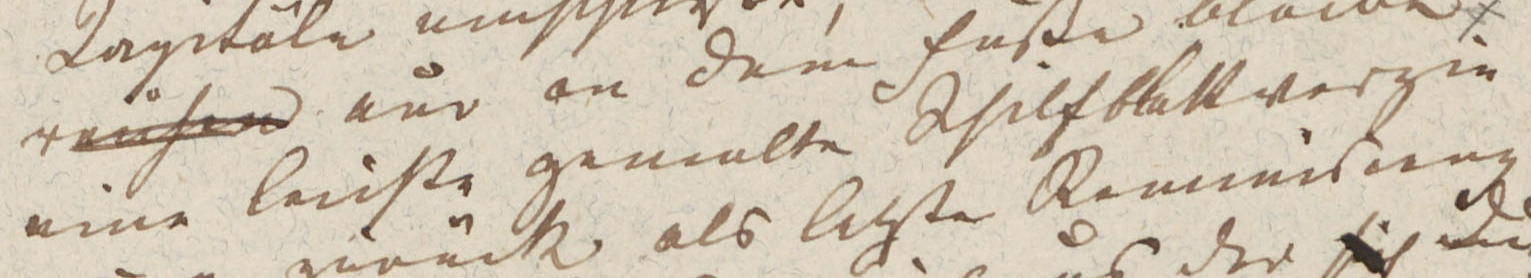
eine leichte gemalte Schilfblattverzie-
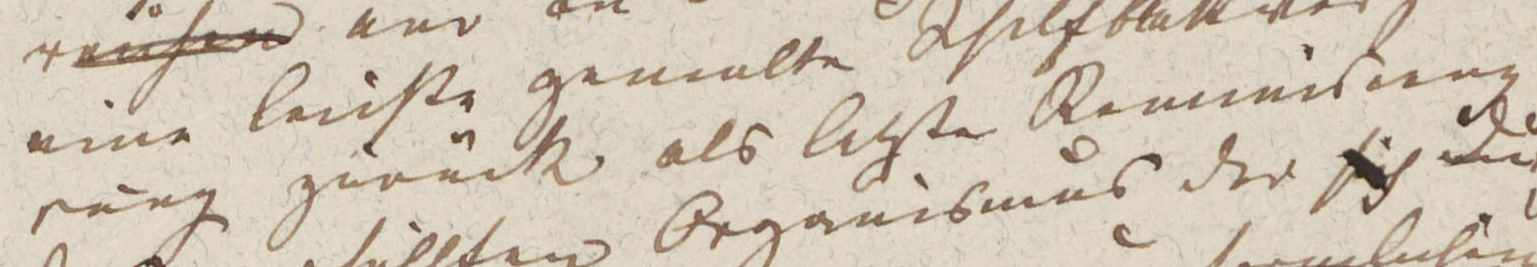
rung zurück als letzte Reminiscenz
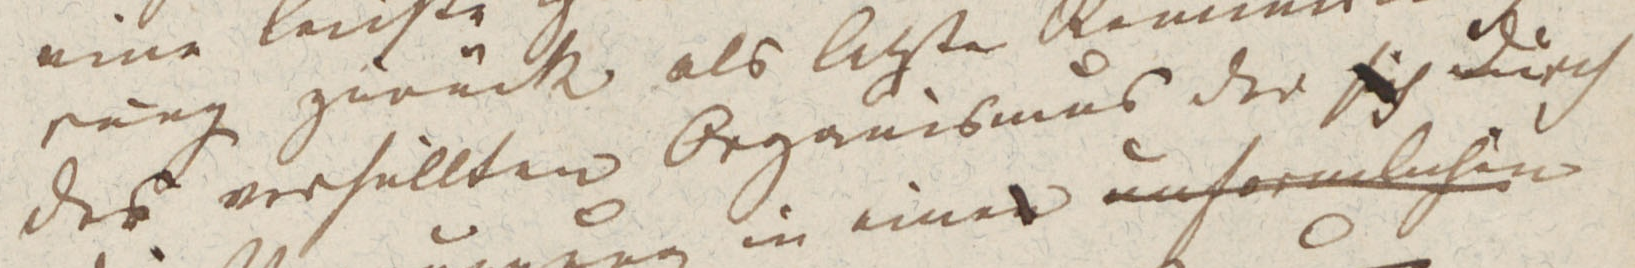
des verhüllten Organismus der sich durch
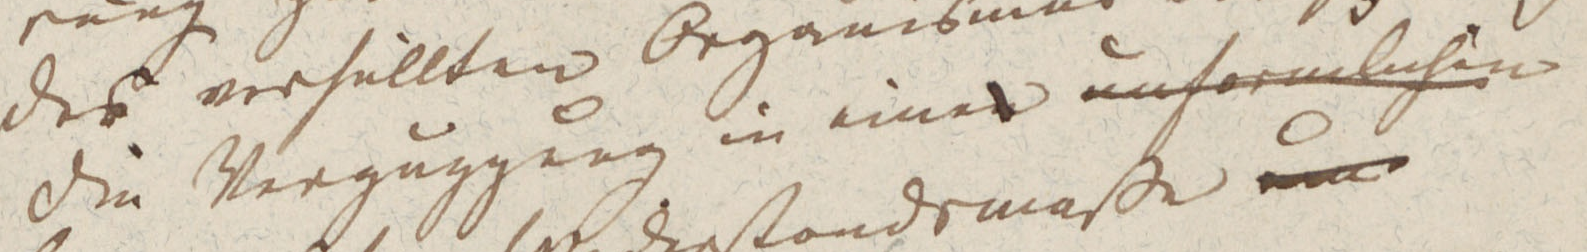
die Verpuppung in einen unformlichen
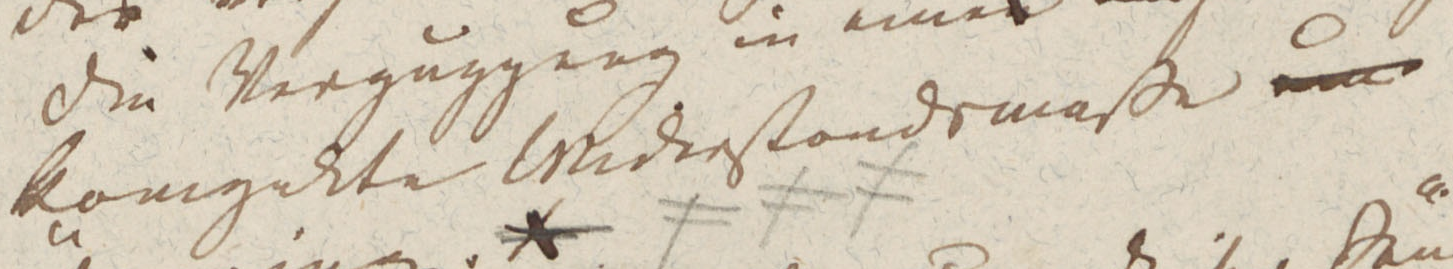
kompakte Widerstandsmasse um
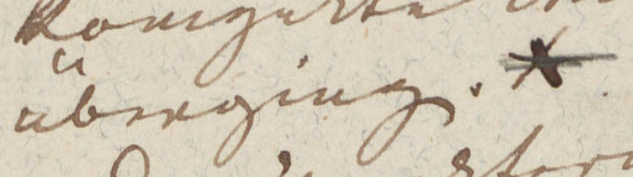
überging. % %
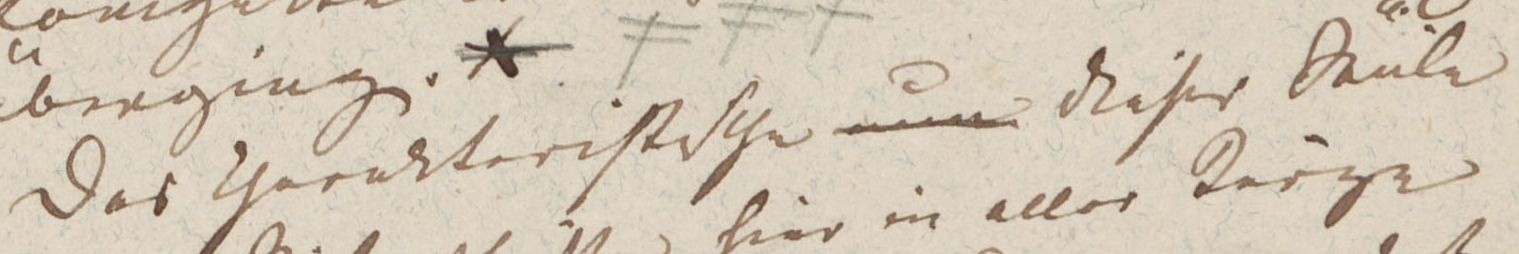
Das Charakteristische nun dieser Säule
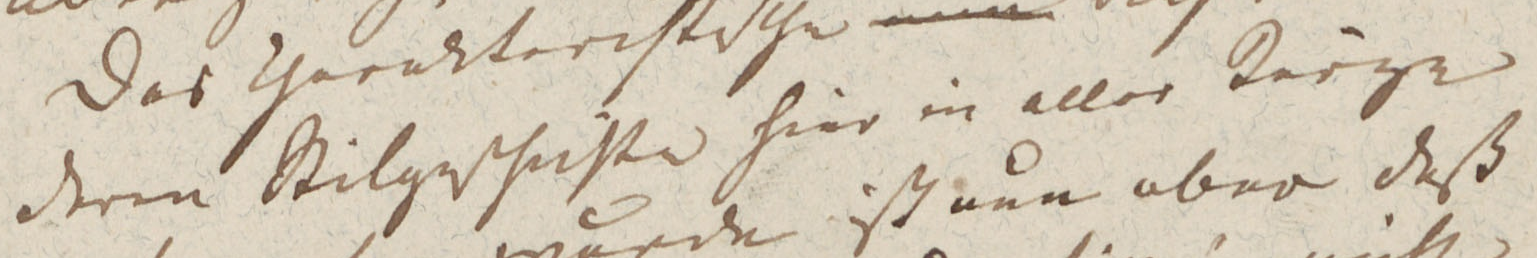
deren Stilgeschichte hier in aller Kürze
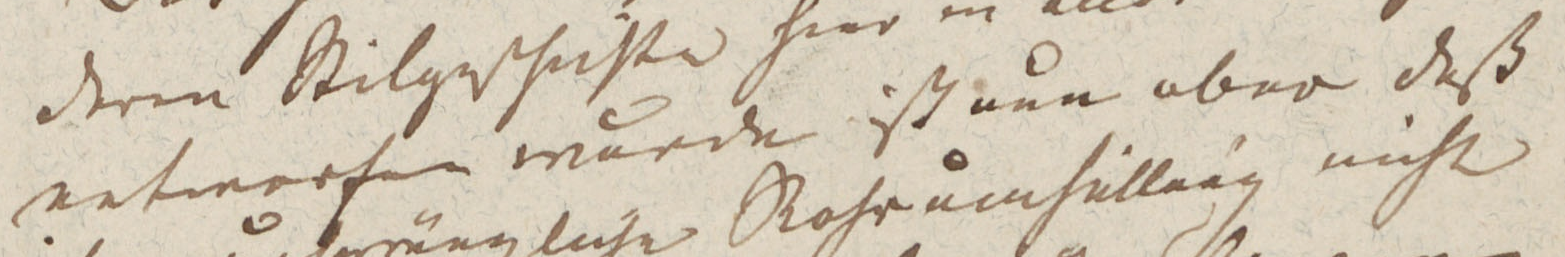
entworfen wurde ist nun aber dass
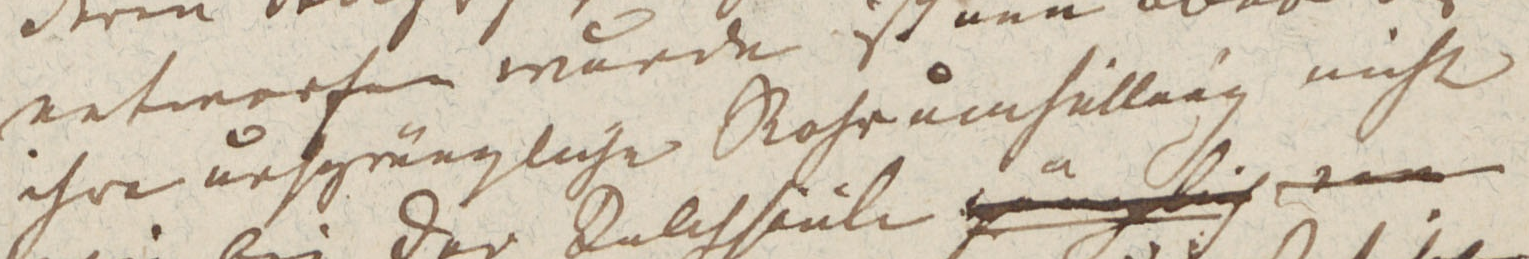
ihre ursprüngliche Rohrumhüllung nicht
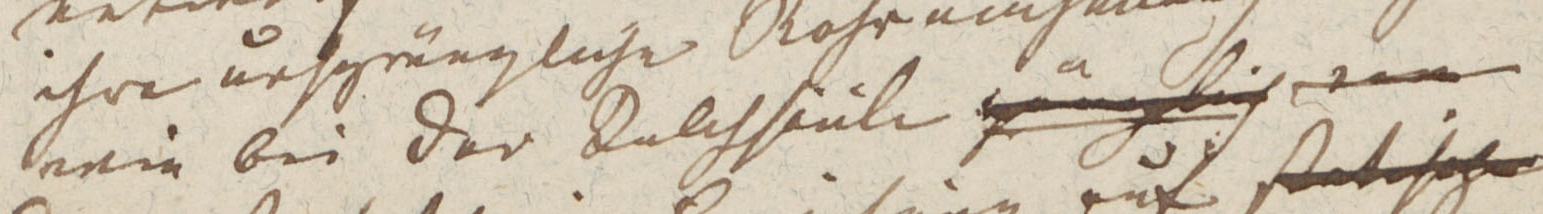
wie bei der Kelchsäule gänzlich von
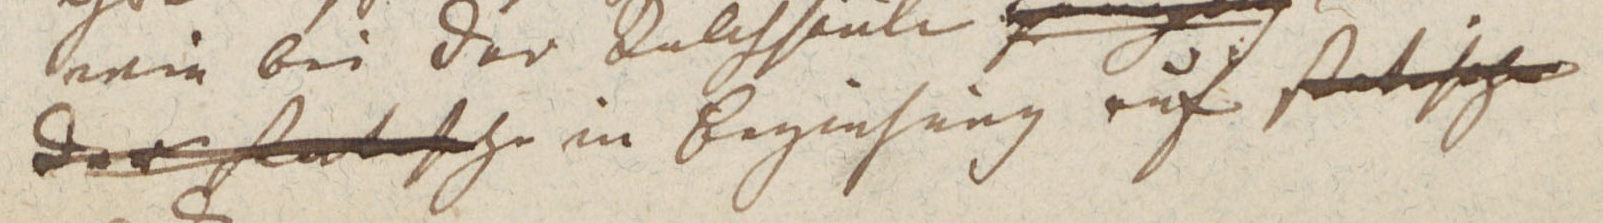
der statische in Beziehung auf statische
